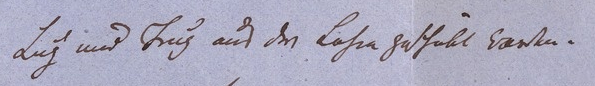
Lug und Trug aus der Lehre geschickt worden.
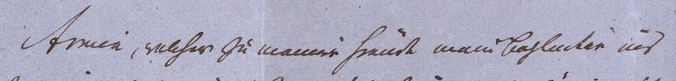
Armin, welcher zu meiner Freude mein Begleiter in
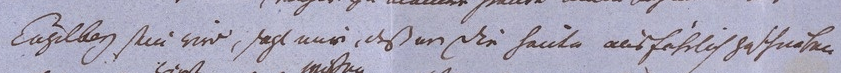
Engelberg sein wird, sagt mir, daß er Dir heute ausführlich geschrieben
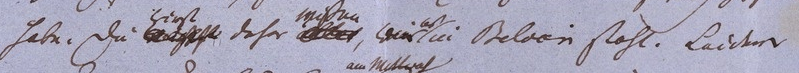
habe. Du ...wirst... daher wißen, wie es in Belvoir steht. Leider
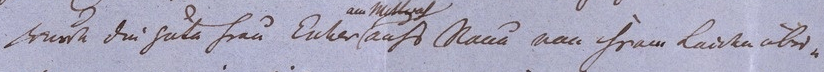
gute Frau Escheram Mittwoch aufs Neue von ihrem Leiden über-
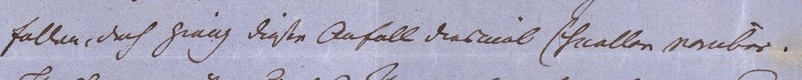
fallen, doch gieng dieser Anfall diesmal schneller vorüber.
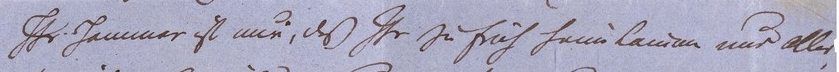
Ihr Jammer ist nur, daß Ihr zu früh heim kommen und alles,
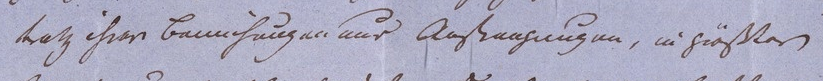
trotz ihrer Bemühungen und Anstrengungen, in größter
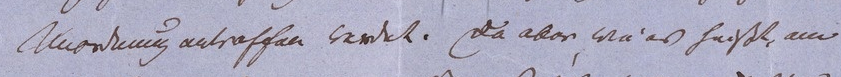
Unordnung antreffen werdet. Da aber, wie es heißt, am
